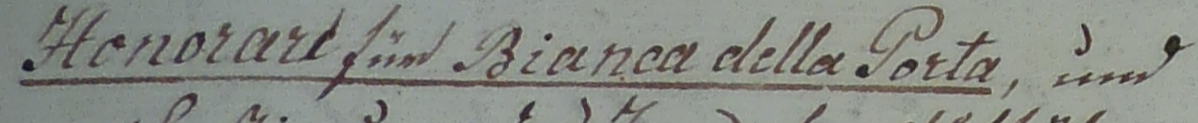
Honorare für Bianca della Porta, und
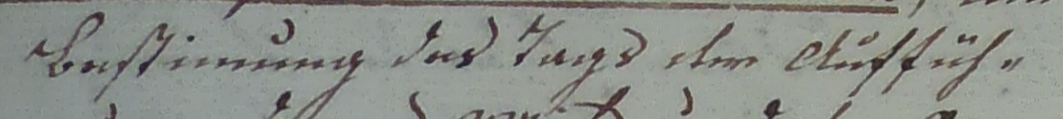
Bestimung des Tags der Auffüh¬
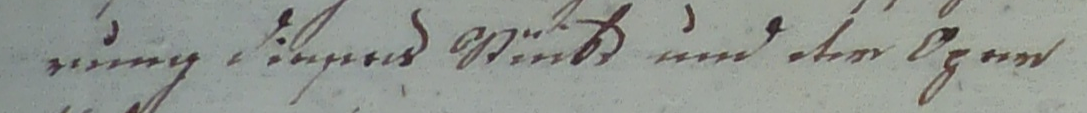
rung dieses Stücks und der Oper
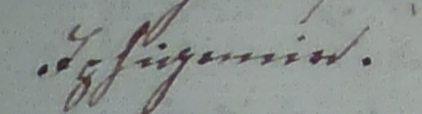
Iphigenie.
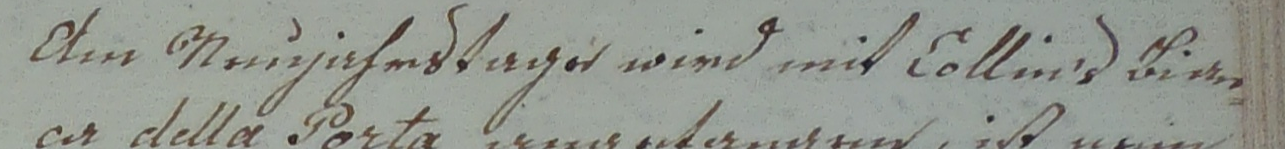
Am Neujahrstage wird mit Collin‘s Bian¬
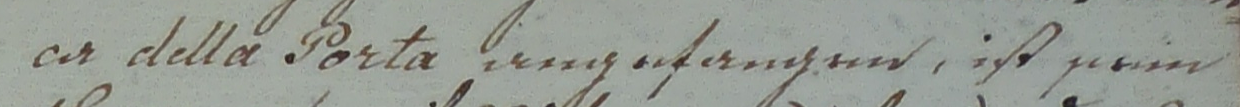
ca della Porta angefangen, ist sein
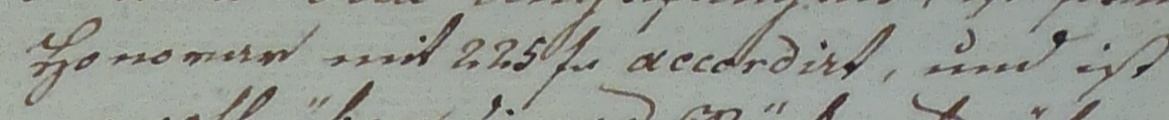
Honorar mit 225 fr accordirt, und ist
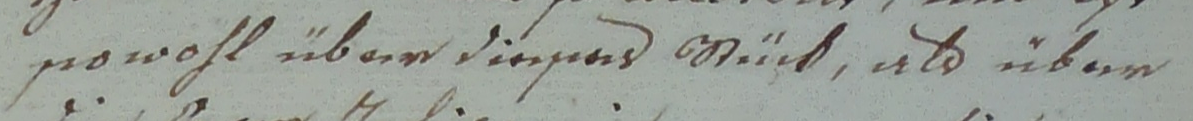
sowohl über dieses Stück, als über
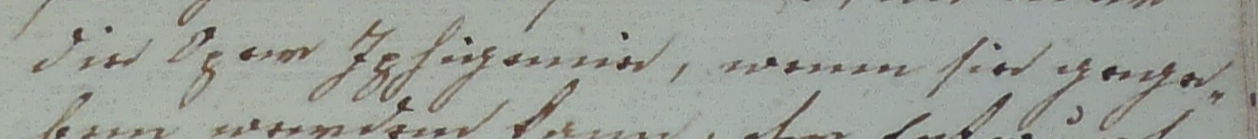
die Oper Ipghigenie, wenn sie gege¬
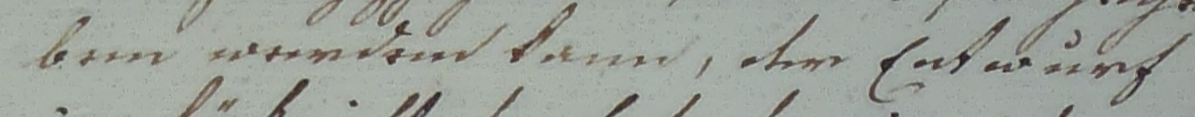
ben werden kann, der Entwurf
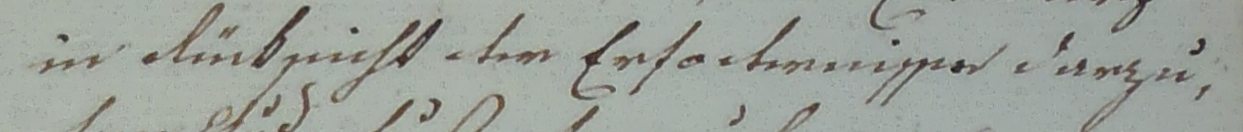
in Rücksicht der Erfodernisse darzu,
